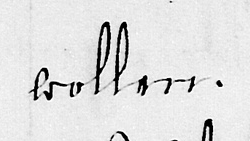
wollen.
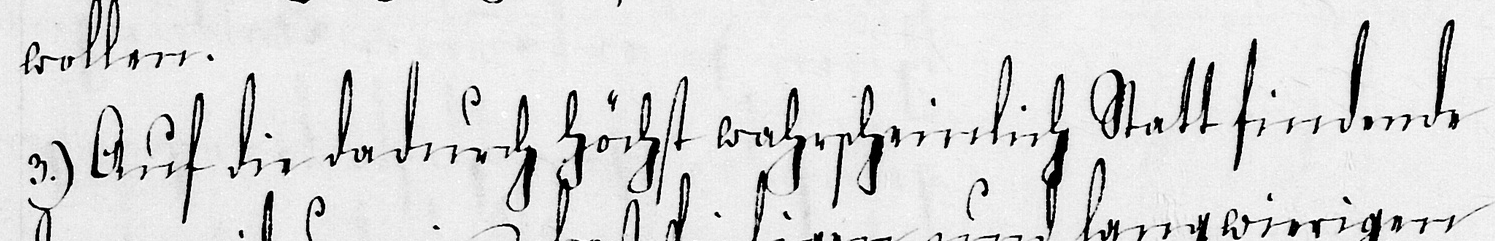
3.) Auf die dadurch höchst wahrscheinlich Statt findende
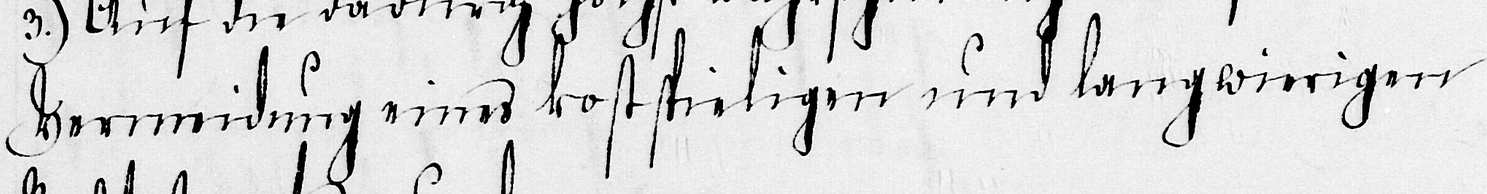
Vermeidung eines kostspieligen und langwierigen
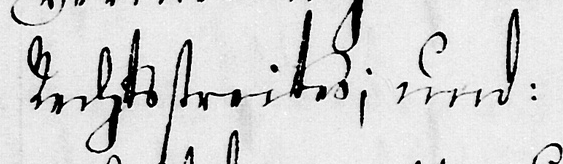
Rechtsstreites; und:
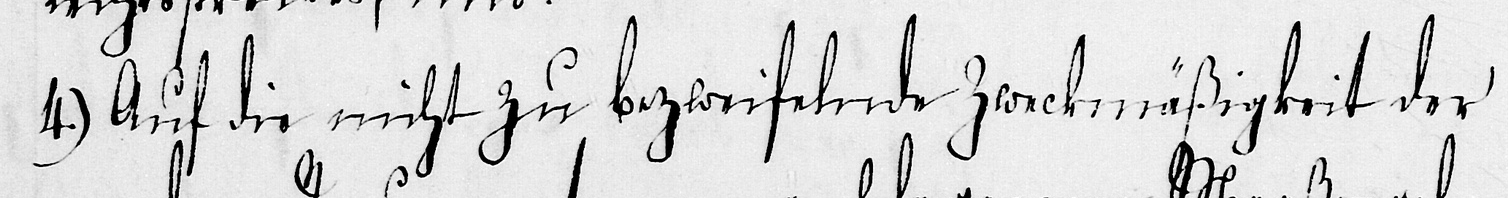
4.) Auf die nicht zu bezweifelnde Zweckmäßigkeit der
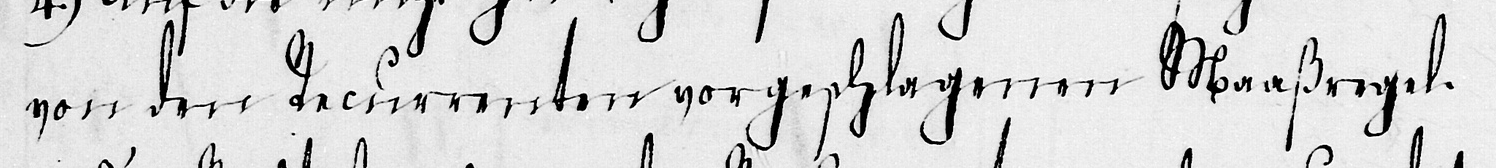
von den Recurrenten vorgeschlagenen Maaßregel.
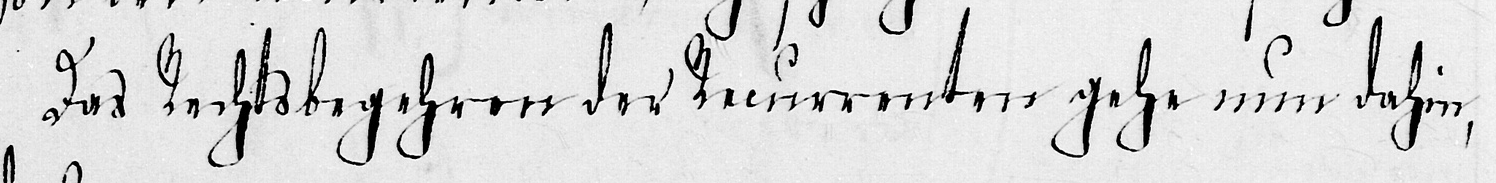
Das Rechtsbegehren der Recurrenten gehe nun dahin,
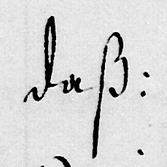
daß:
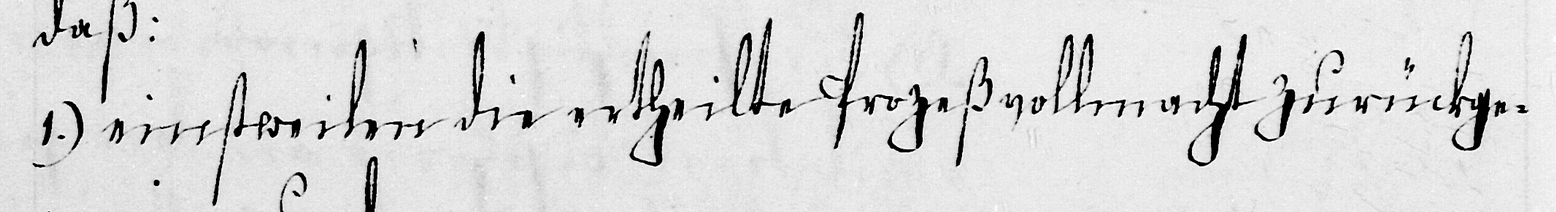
1.) einstweilen die ertheilte Prozeßvollmacht zurückge¬
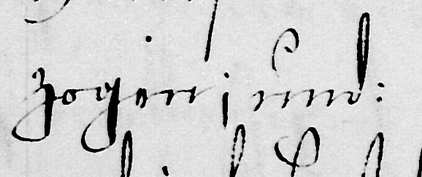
zogen; und:
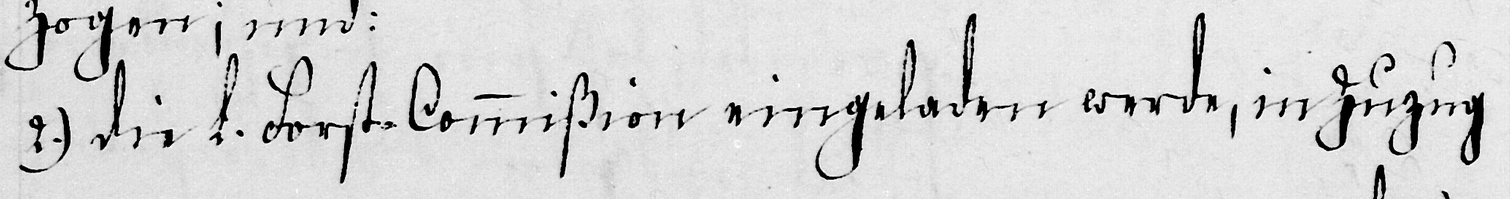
2.) die L. Forst-Commißion eingeladen werde, in Zuzug
